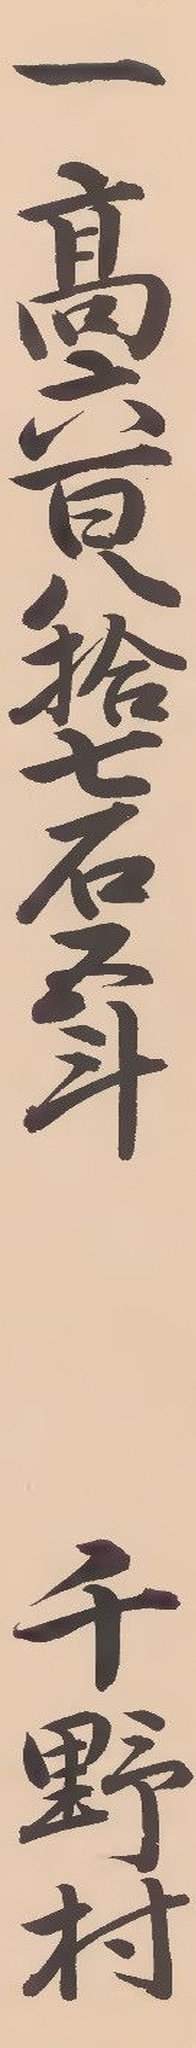一高六百八拾七石五斗千野村
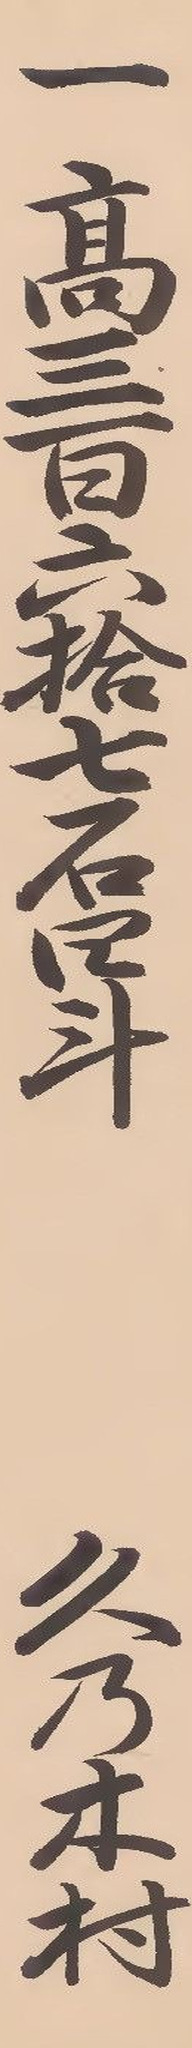一高三百六拾七石四斗久乃木村
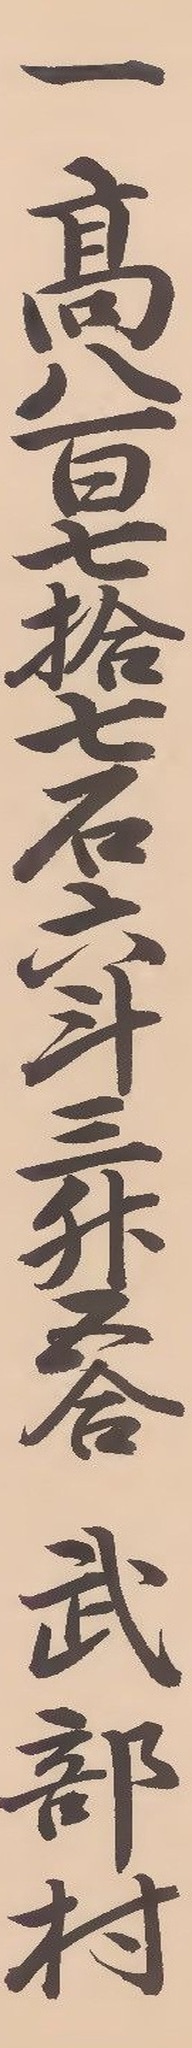一高八百七拾七石六斗三升五合武部村
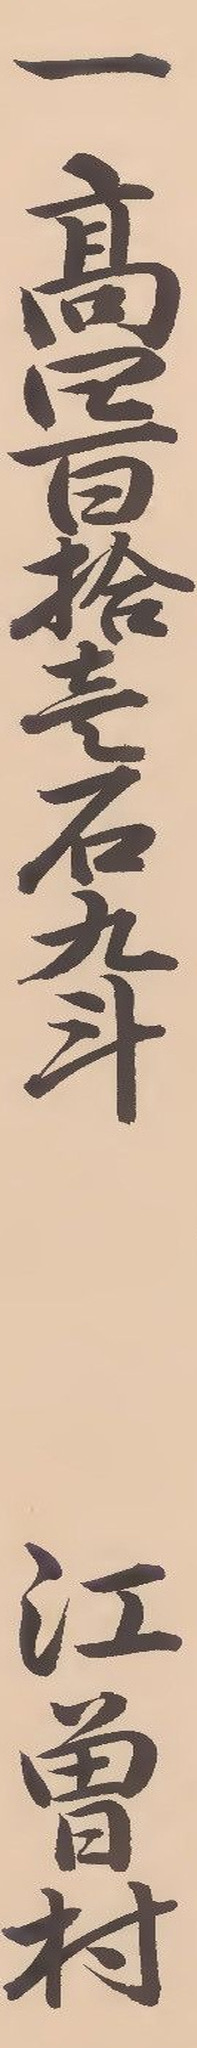一高四百拾壱石九斗江曽村

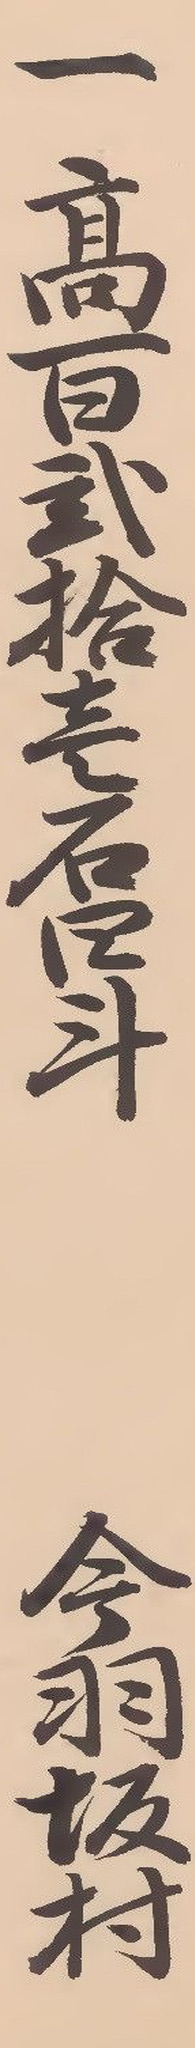一高百弐拾壱石四斗今羽坂村
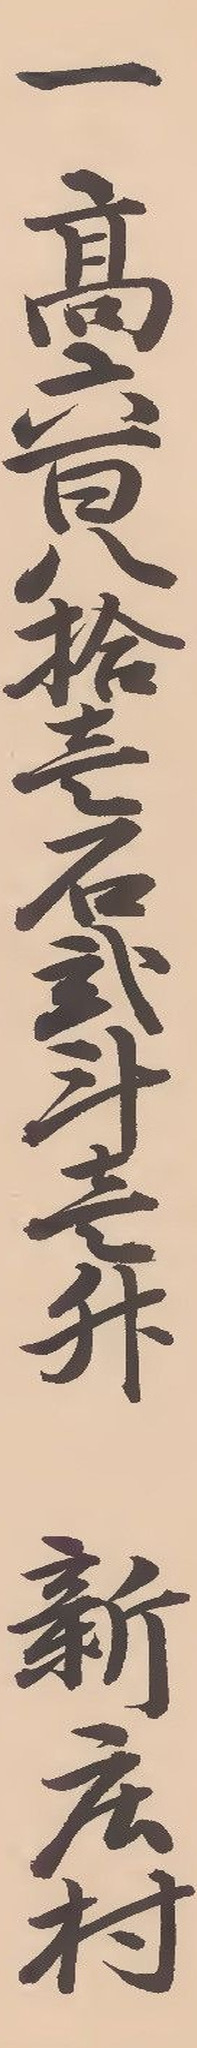一高六百八拾壱石弐斗壱升新庄村
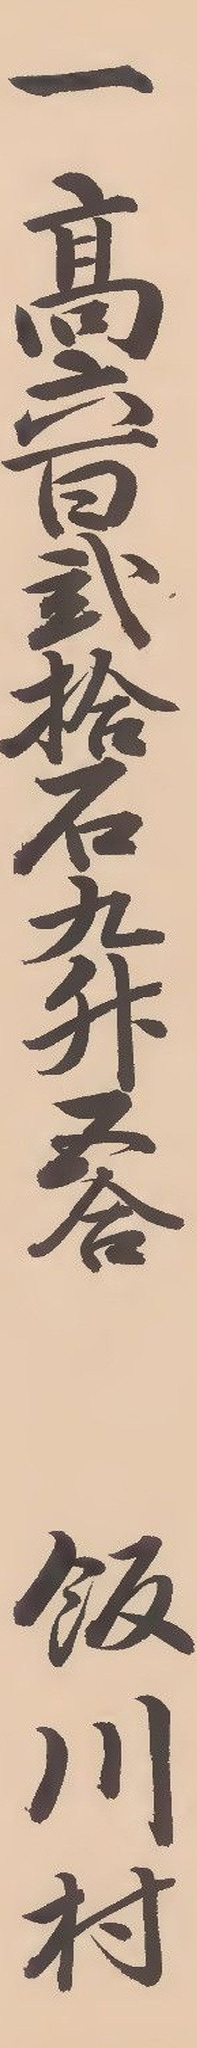一高六百弐拾石九升五合飯川村
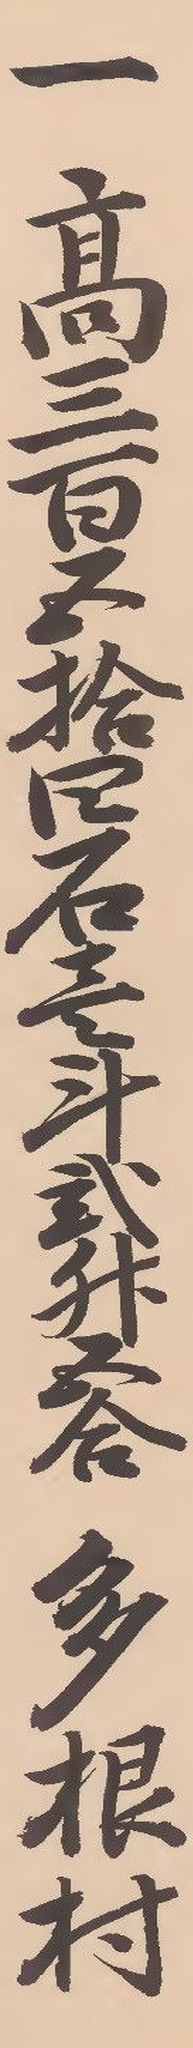一高三百五拾四石壱斗弐升五合多根村
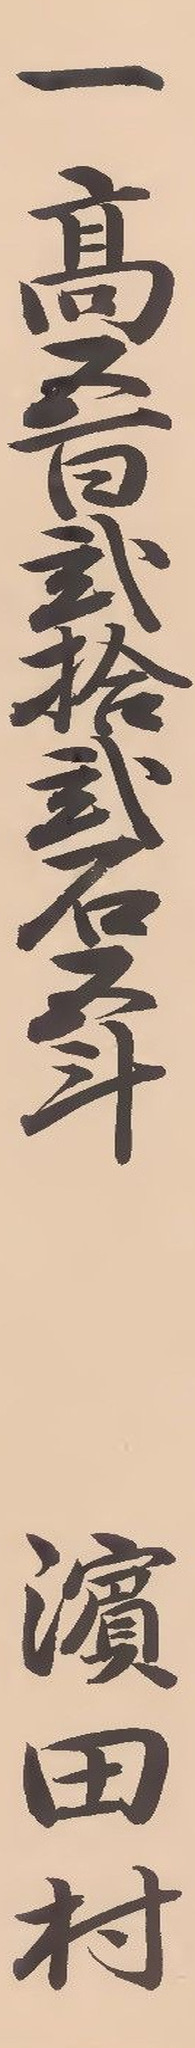一高五百弐拾弐石五斗浜田村
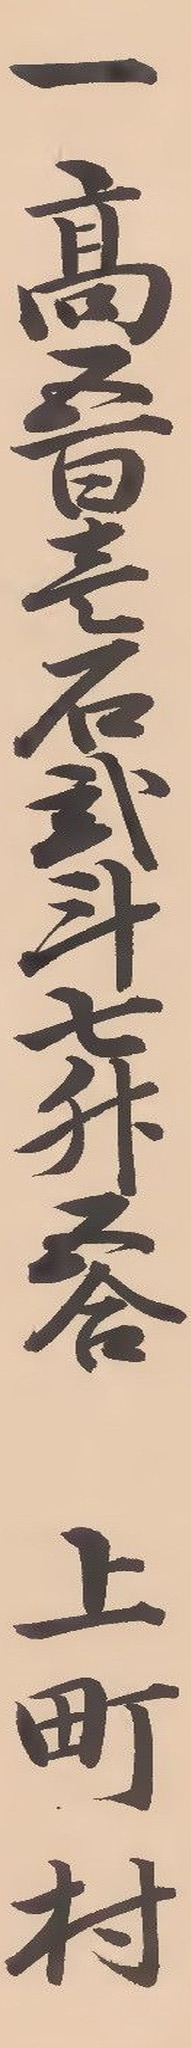一高五百壱石弐斗七升五合上町村
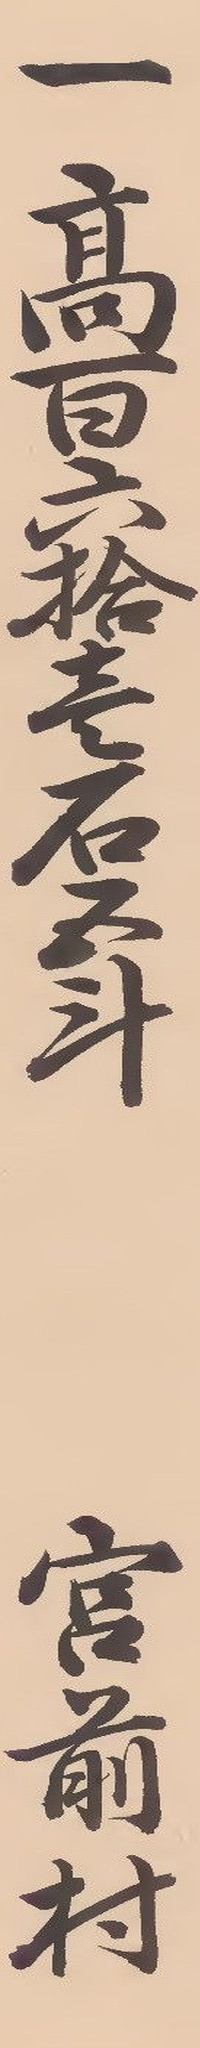一高百六拾壱石五斗宮前村

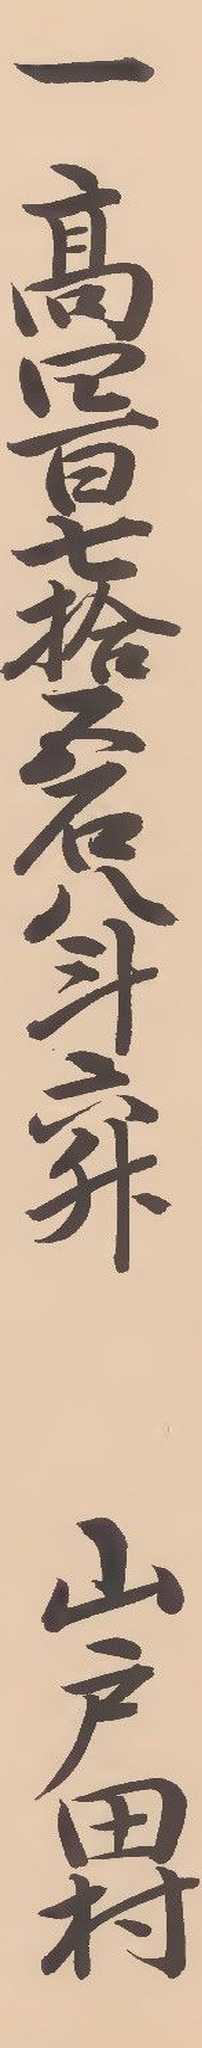一高四百七拾五石八斗六升山戸田村
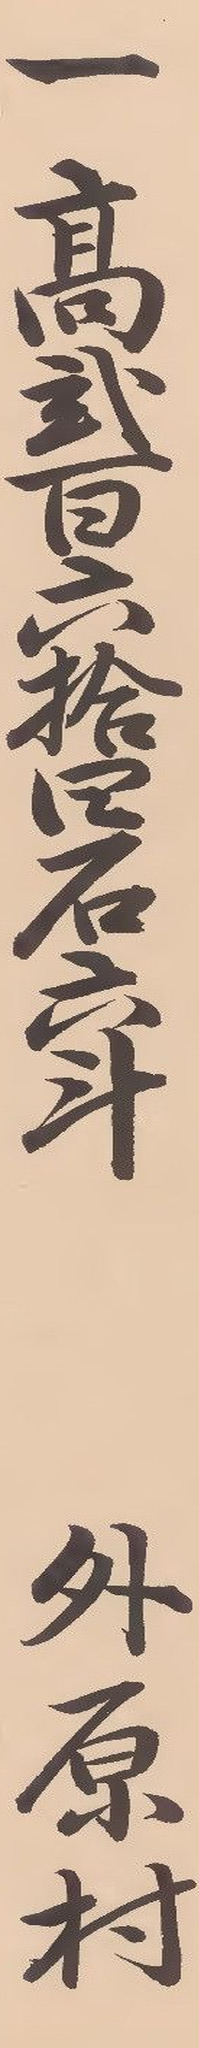一高弐百六拾四石六斗外原村
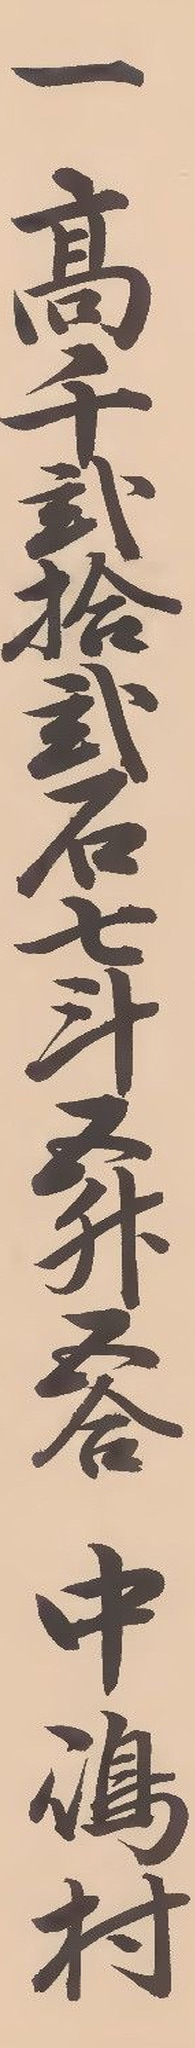一高千弐拾弐石七斗五升五合中島村
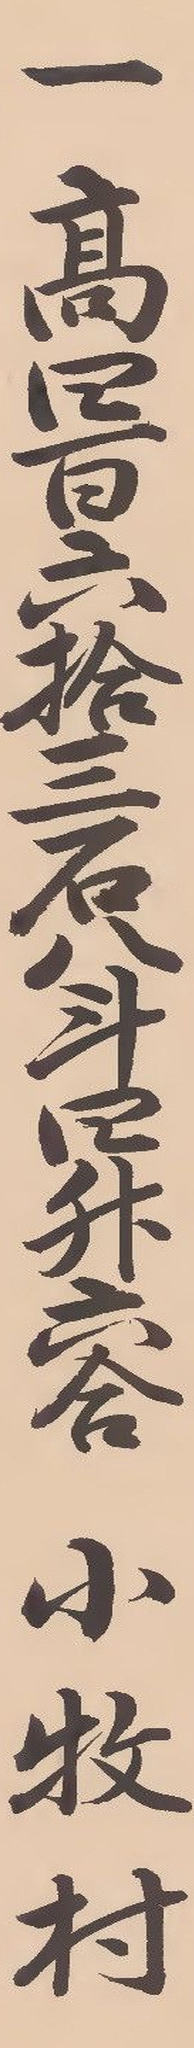一高四百六拾三石八斗四升六合小牧村
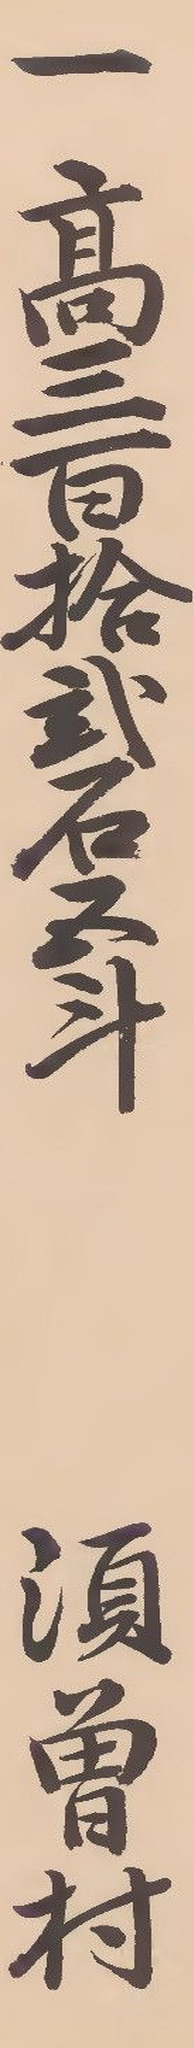一高三百拾弐石五斗須曽村
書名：能登国郷帳
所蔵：国立公文書館 National Archives of Japan
